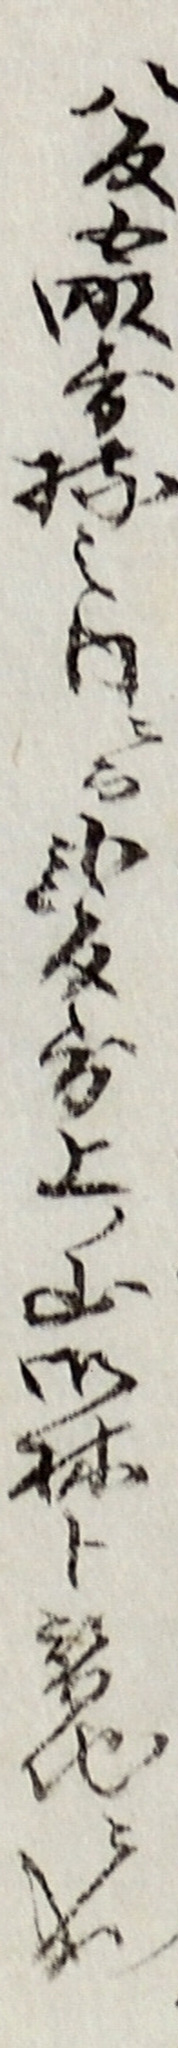八反五畝歩持之内ニ而弐反歩上ノ山御林ト替地ニ成
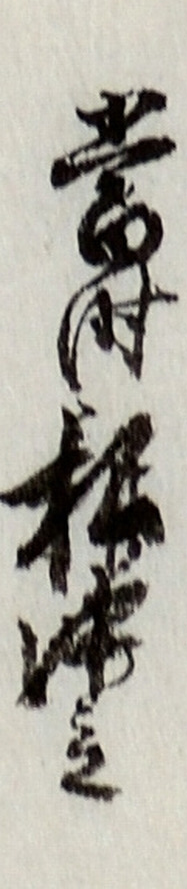当時松中立
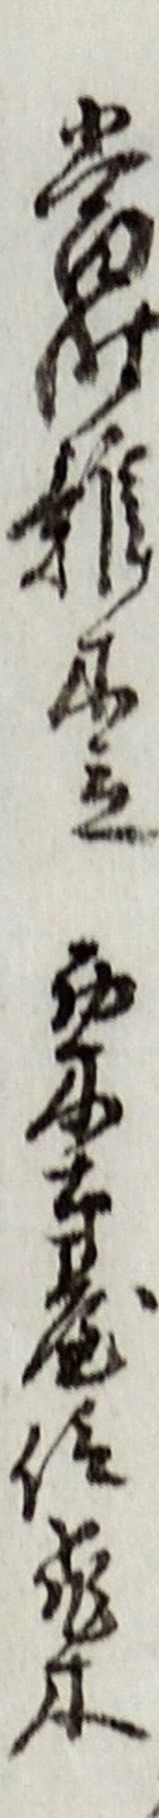当時雑木立栗土台位飛木
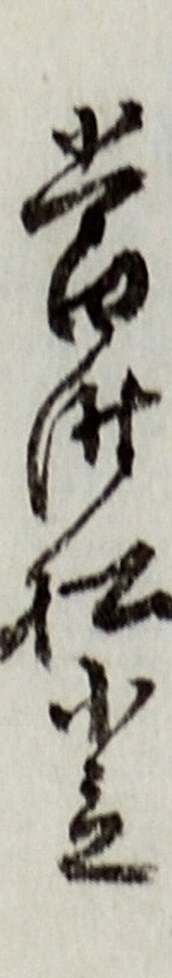当時松小立
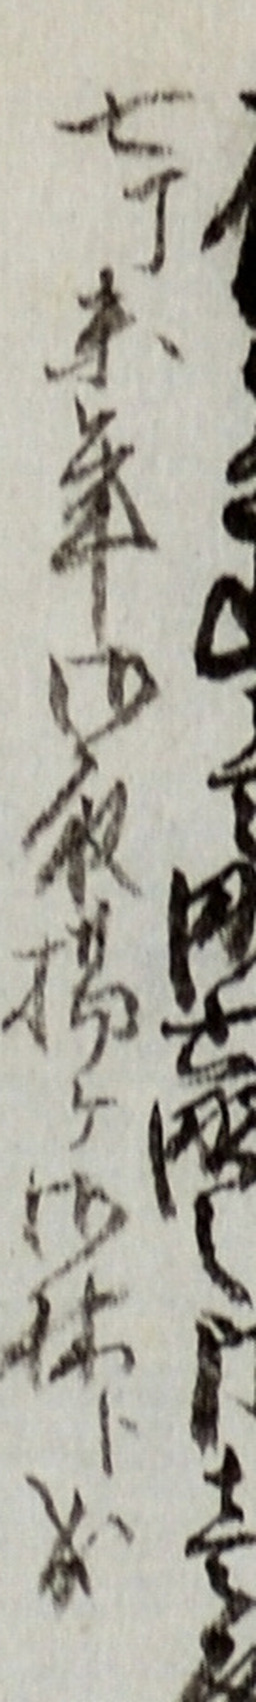七丁未年御取揚ケ御林ト成
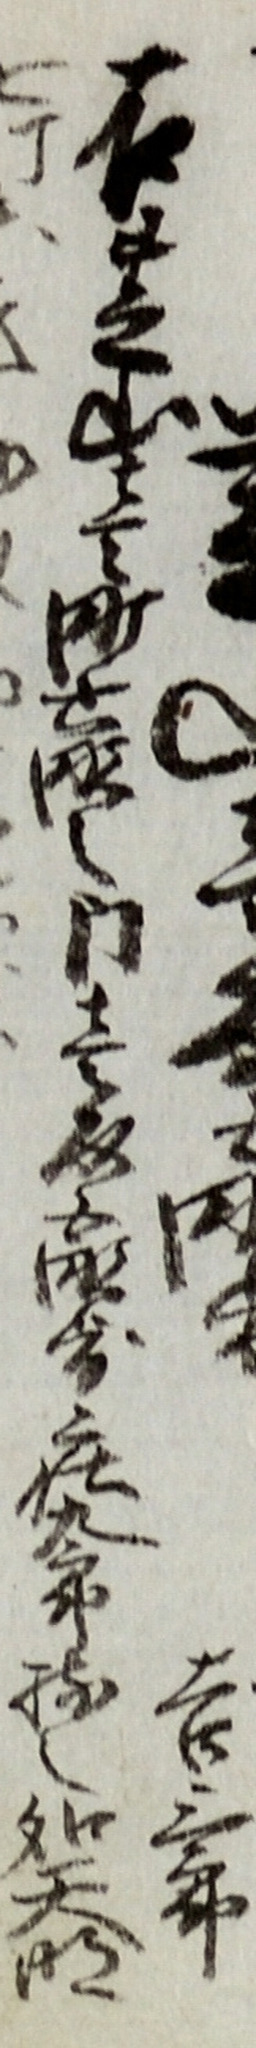右是山壱町六畝之内壱反五畝歩荘九郎持之処天明
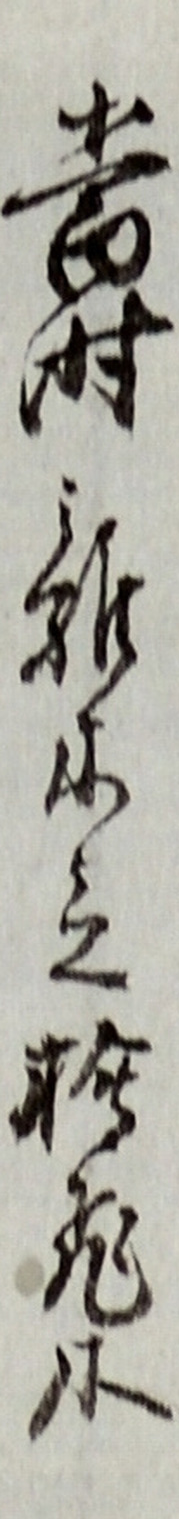当時雑木立檜飛木

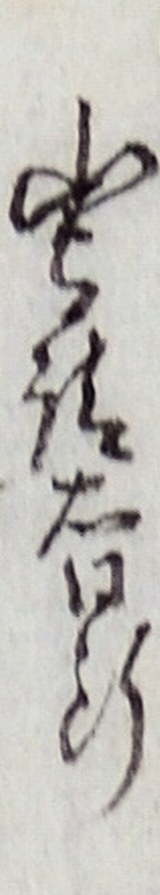山守請右同断
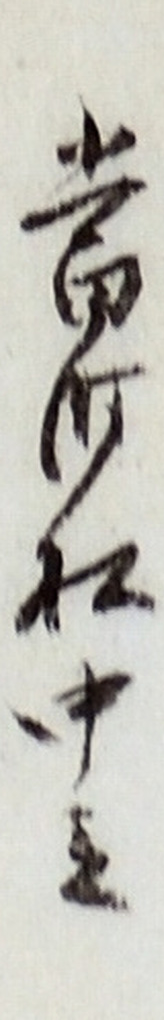当時松中立
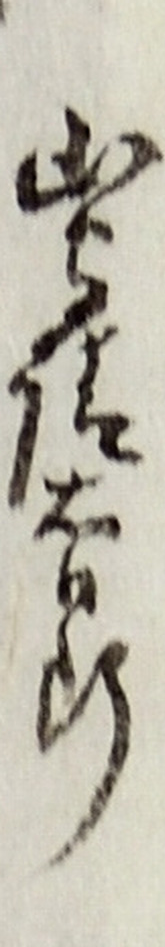山守請右同断
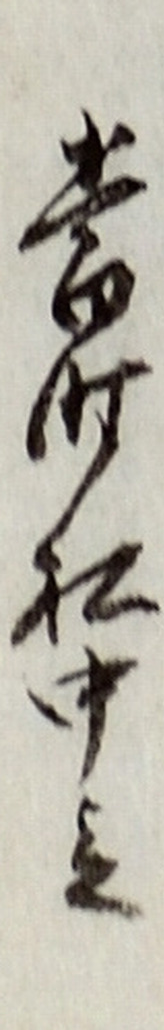当時松中立
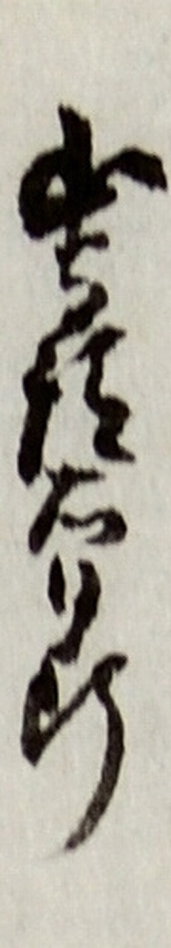山守請右同断
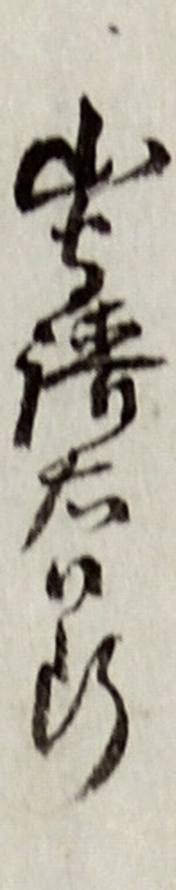山守請右同断
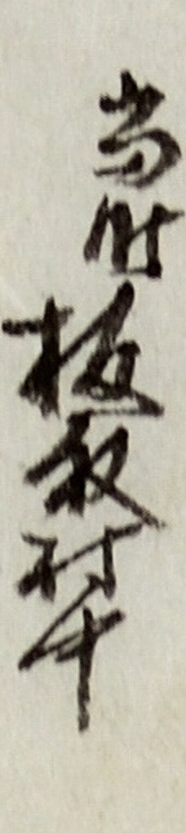当時板取村中
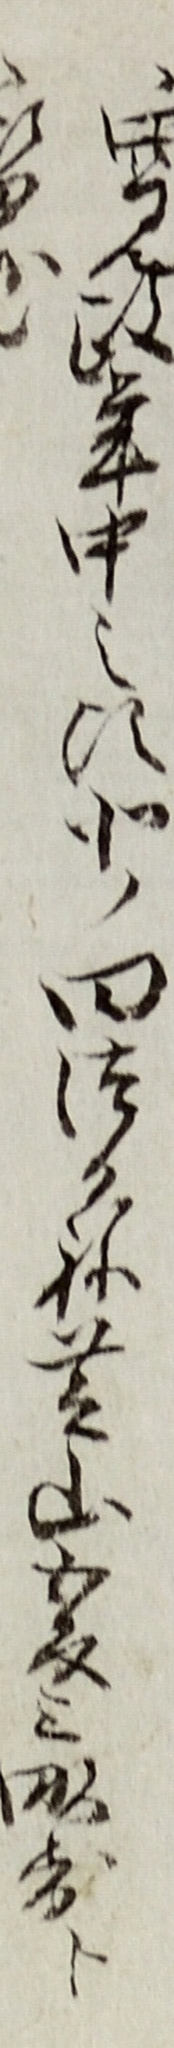寛政年中之頃北ノ田つかね芝山五反三畝歩ト
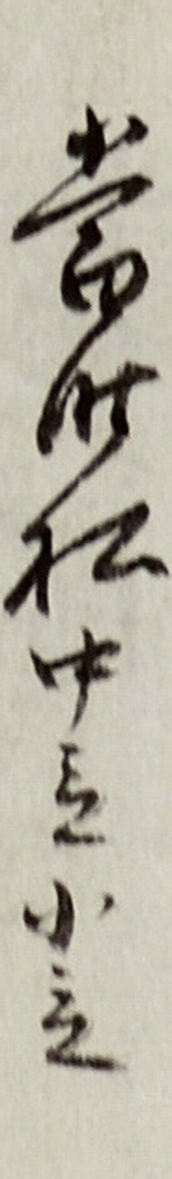当時松中立小立
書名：郷中御林御竹薮名所附守之名前帳
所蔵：伊那市立高遠町図書館・合同会社AMANE
